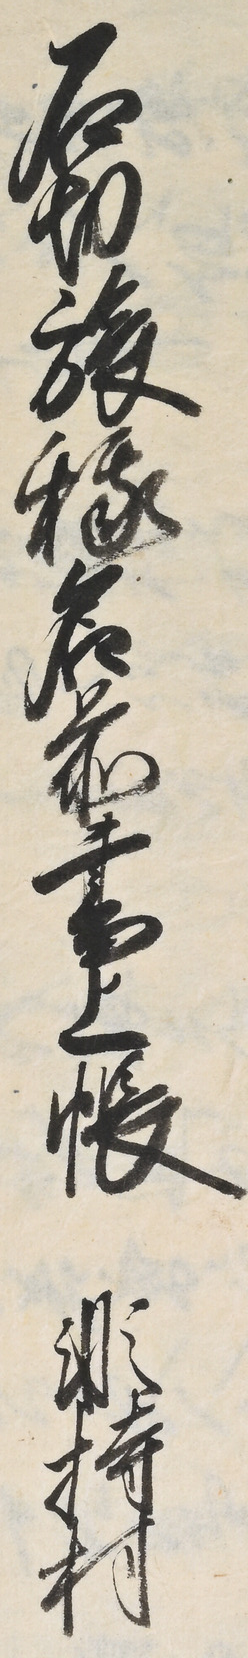石切旅稼名前書上帳非持村

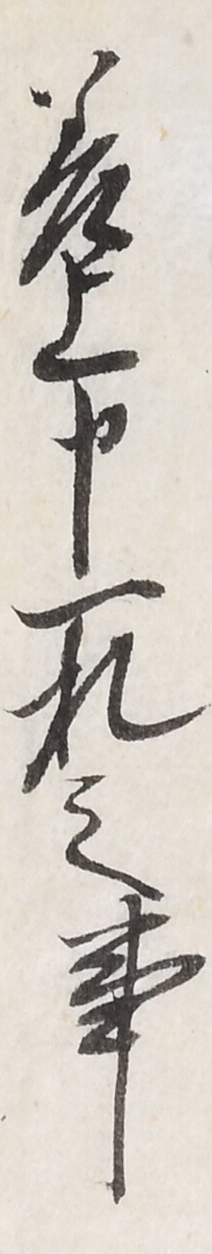差上申一札之事
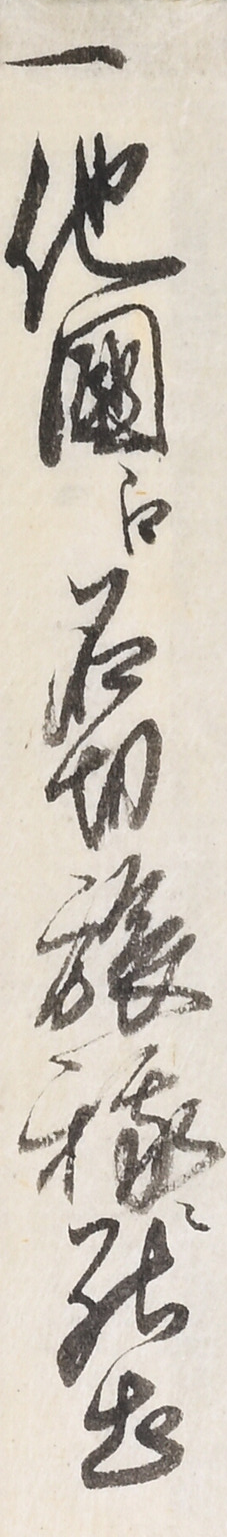一他国え石切旅稼ニ罷出
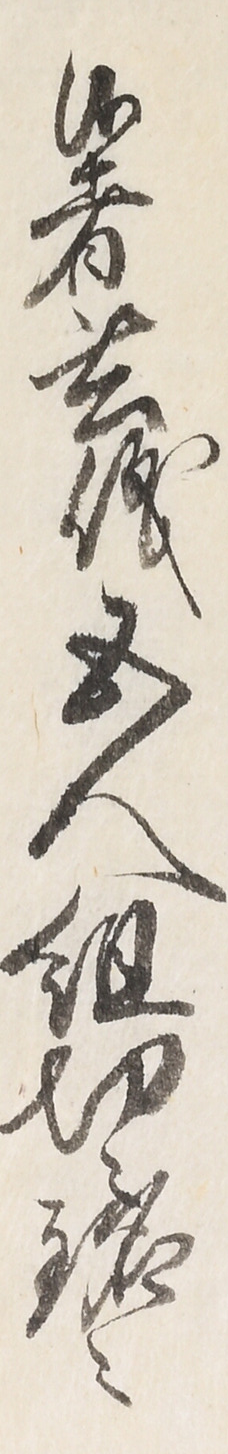候者共儀五人組切ニ銘々
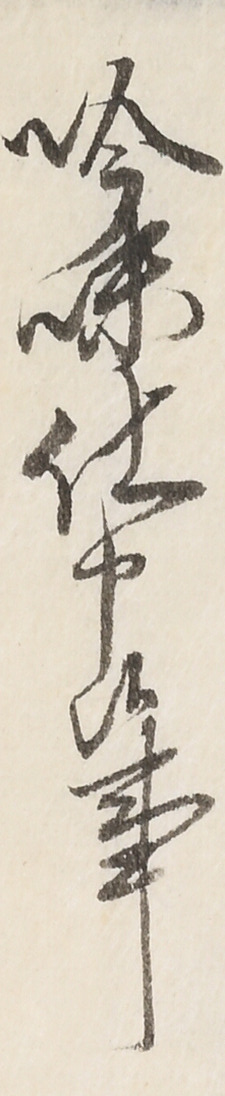吟味仕申候事
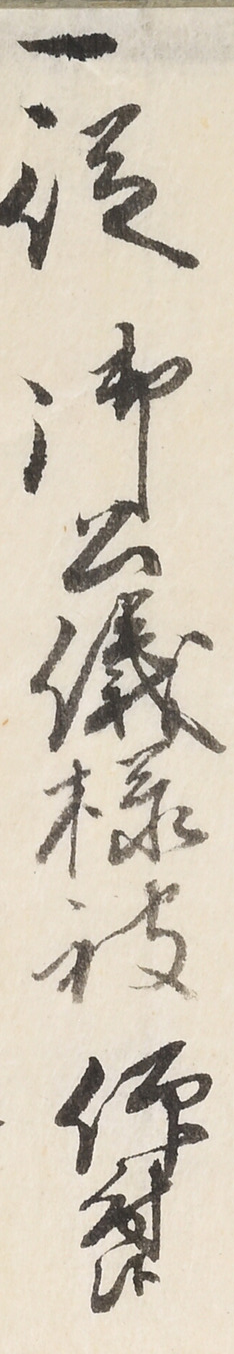一従御公儀様被仰付候
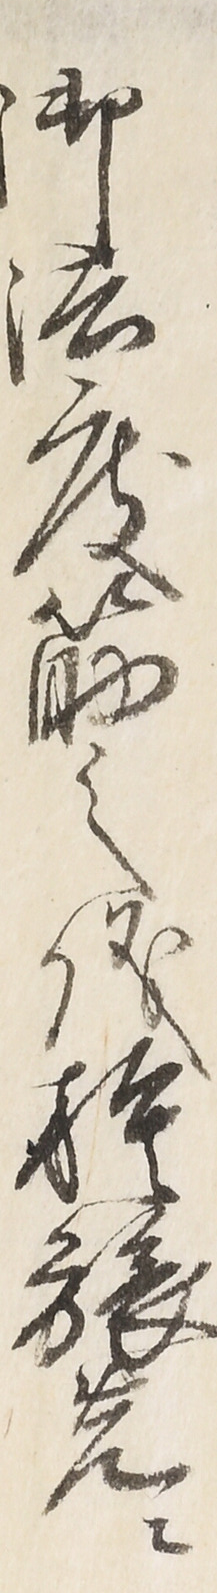御法度筋之儀於旅先ニ
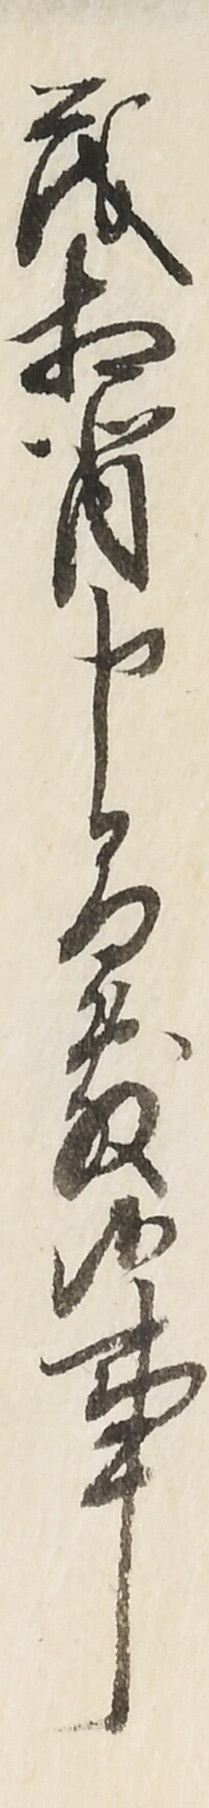も相背申間敷候事
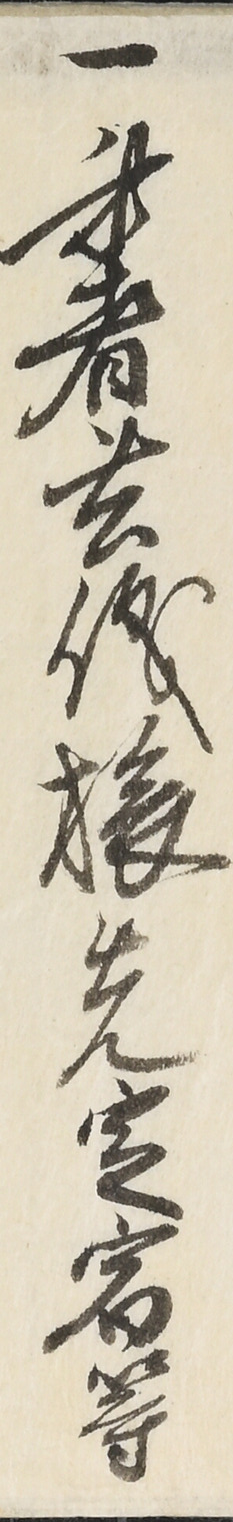一此者共儀旅先定宿等
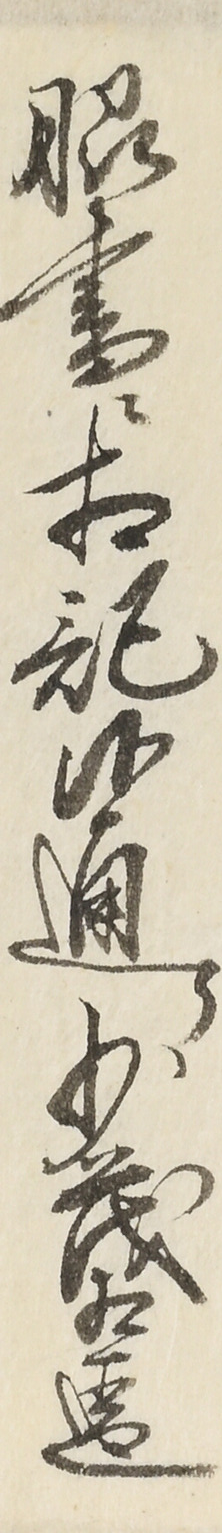脇書ニ相記候通り少も相違
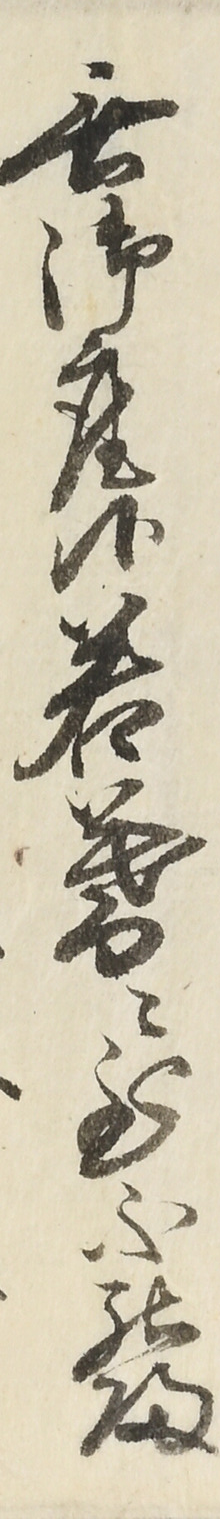無御座候若暮ニ至不罷帰
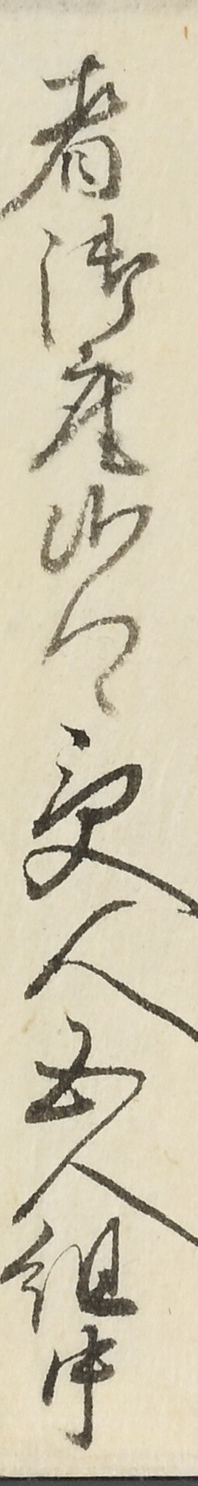者御座候ハヽ受人五人組中
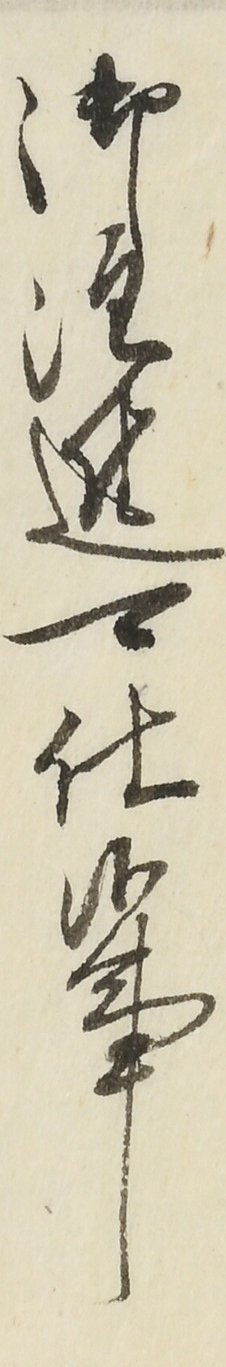御注進可仕候事
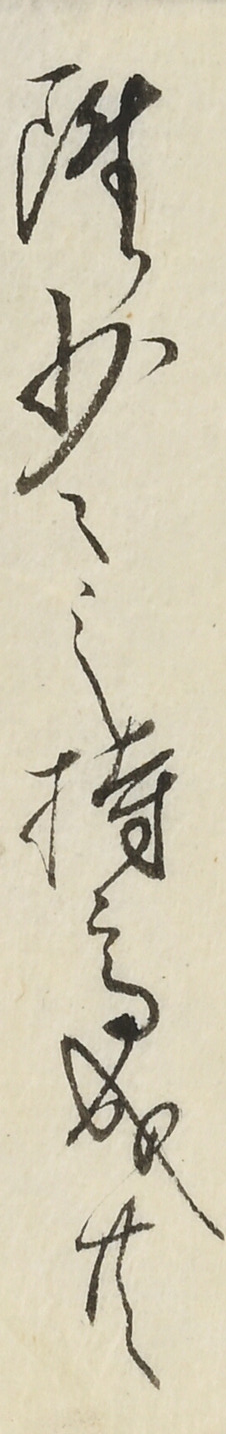附り少々之持高成共

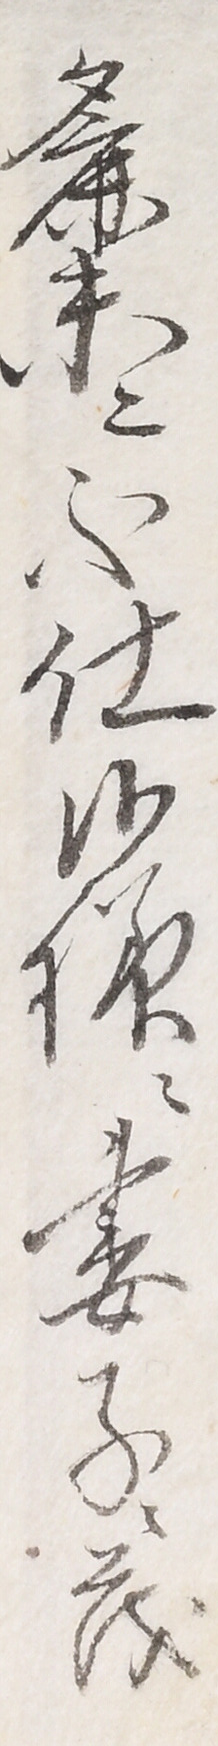麤末ニ不仕候様ニ妻子ニも
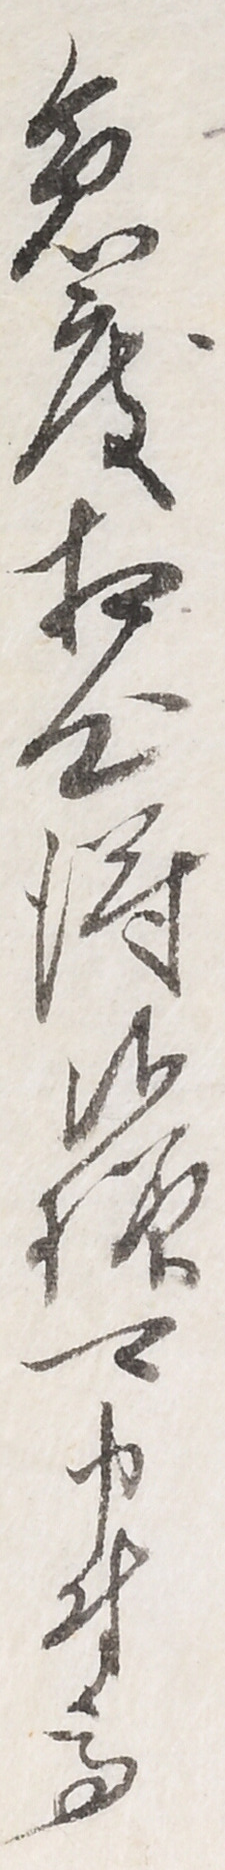急度相心得候様可申付事
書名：萬延二辛酉年正月石切旅稼名前書上帳
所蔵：伊那市立高遠町図書館・合同会社AMANE
